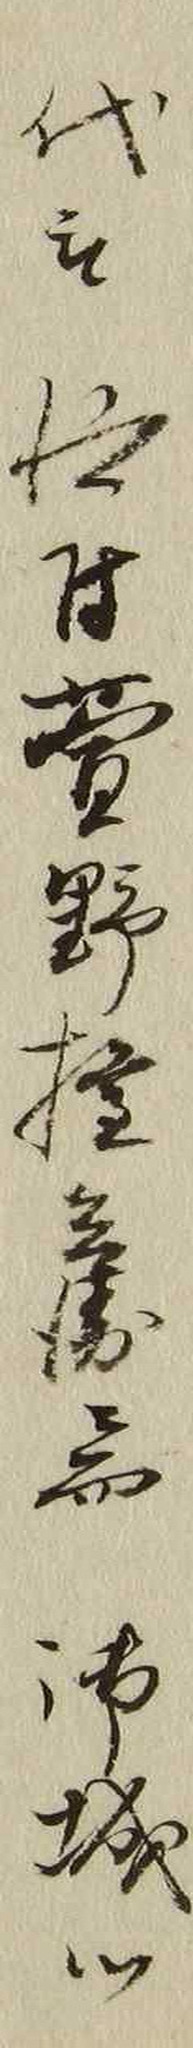代被仰付萱野権兵衛ニ而御城御
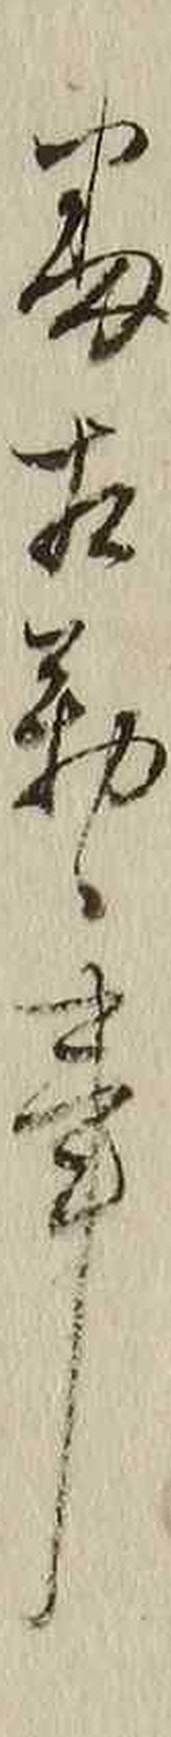番相勤候事
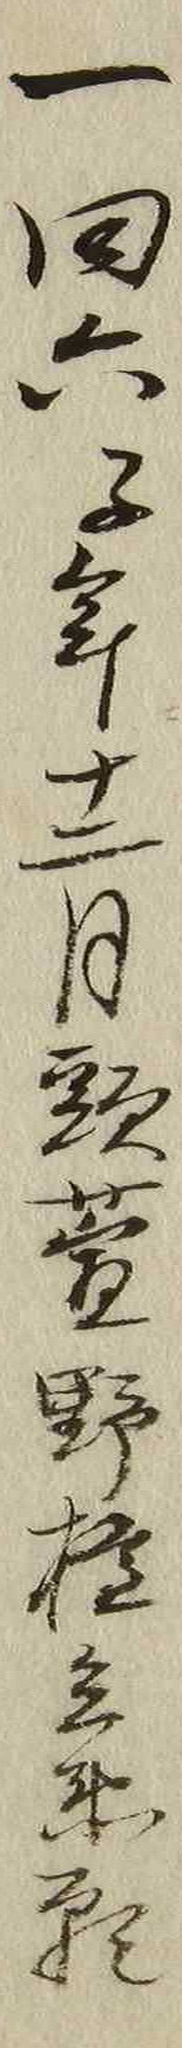一同六子年十二月頭萱野権兵衛願
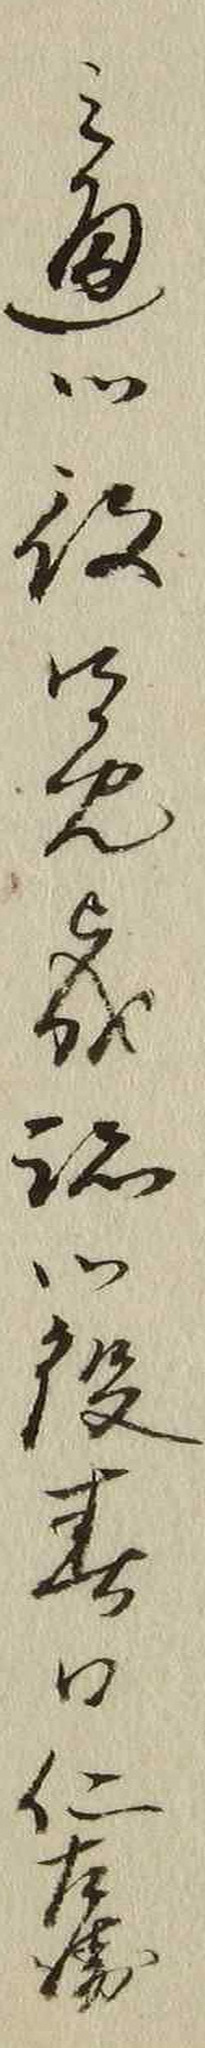之通御役御免被成跡御役春日仁左衛
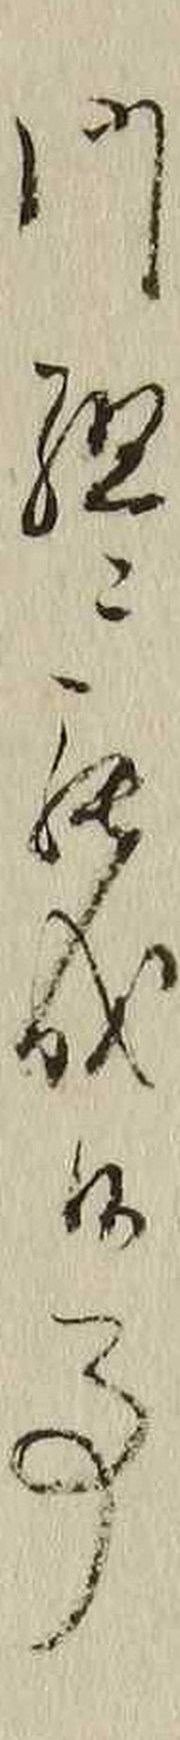門組ニ罷成候事
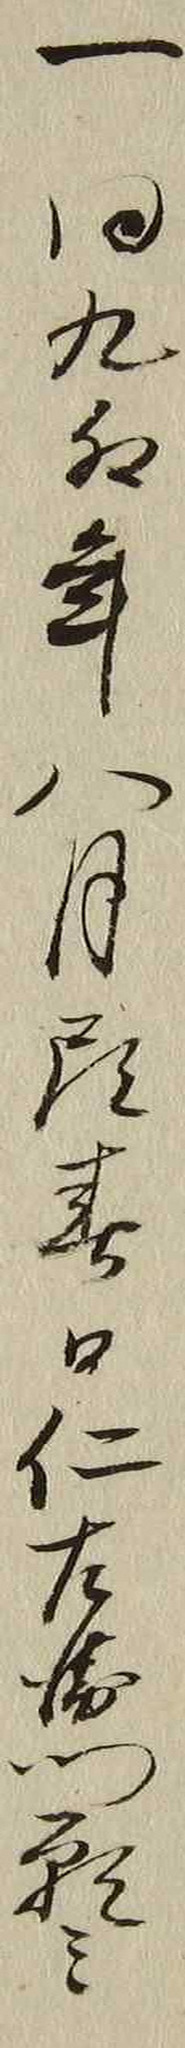一同九卯年八月頭春日仁左衛門願之
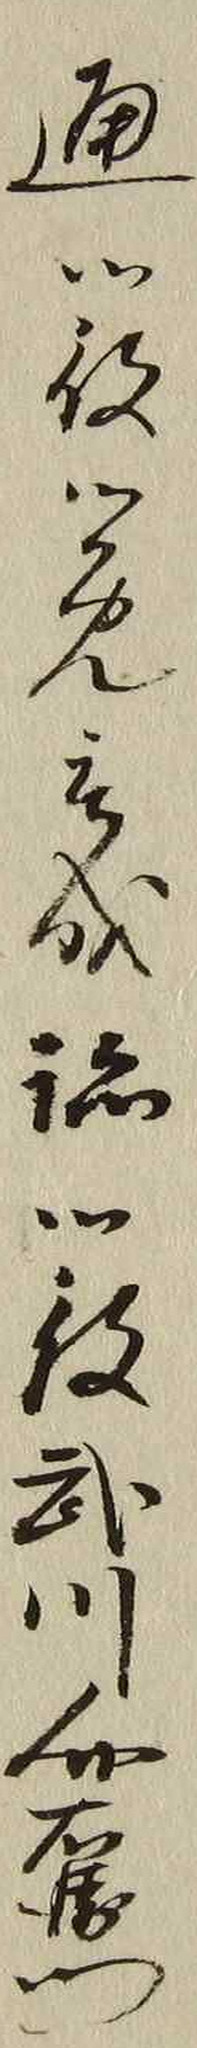通御役御免被成跡御役武川介右衛門
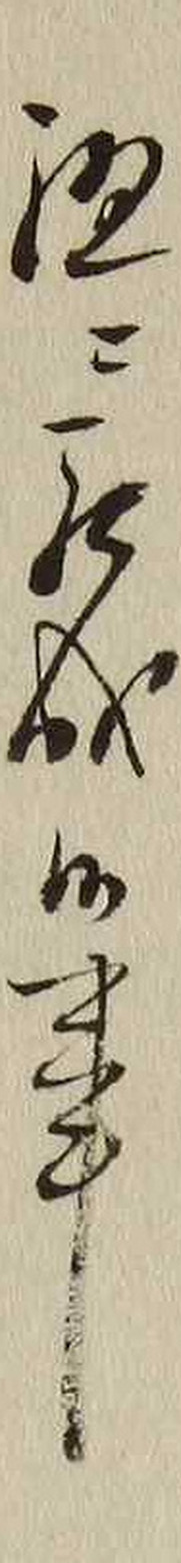組ニ罷成候事
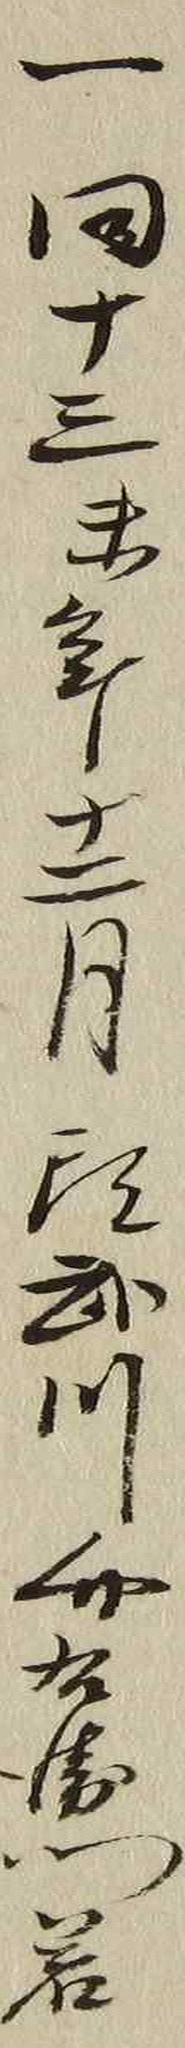一同十三未年十二月頭武川介右衛門若
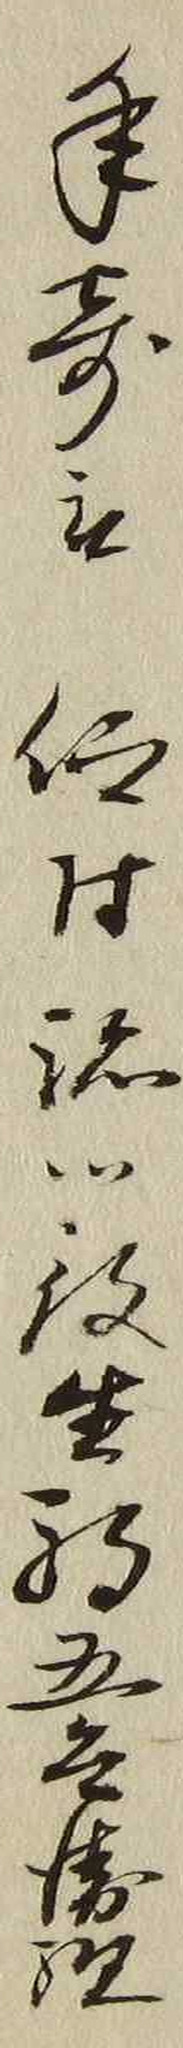年寄被仰付跡御役生駒五兵衛組
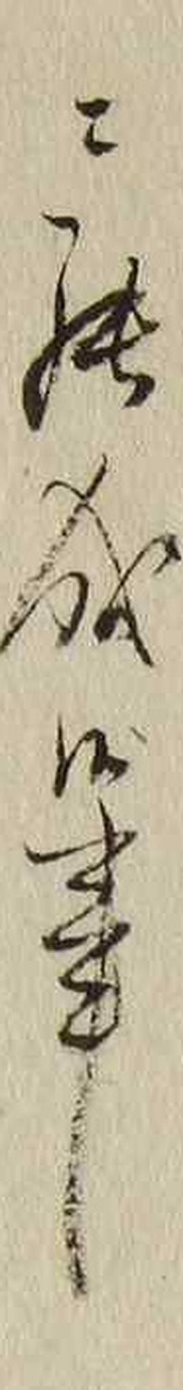ニ罷成候事
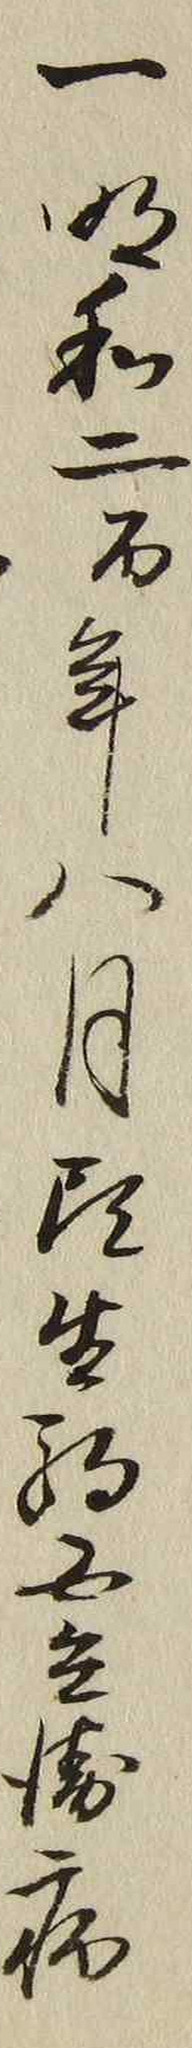一明和二酉年八月頭生駒五兵衛病
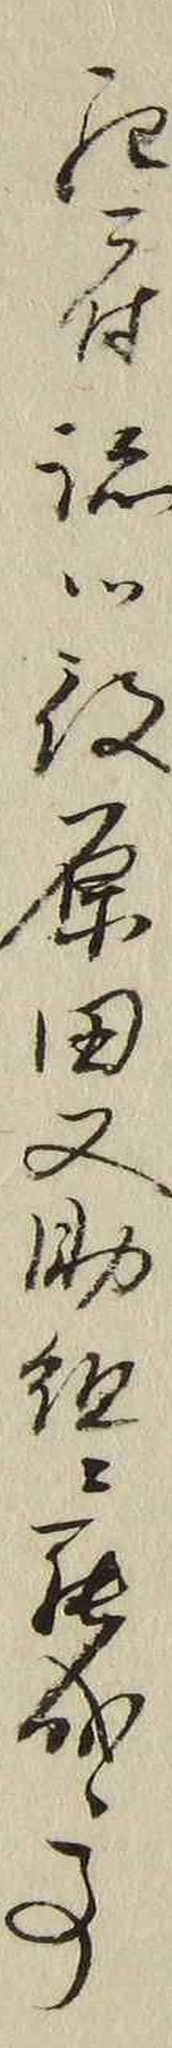死ニ付跡御役原田又助組ニ罷成候事
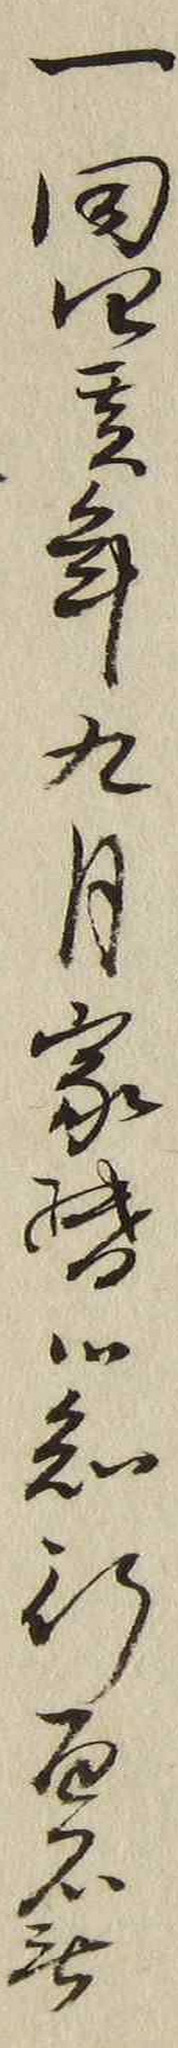一同四亥年九月家督御知行百石無
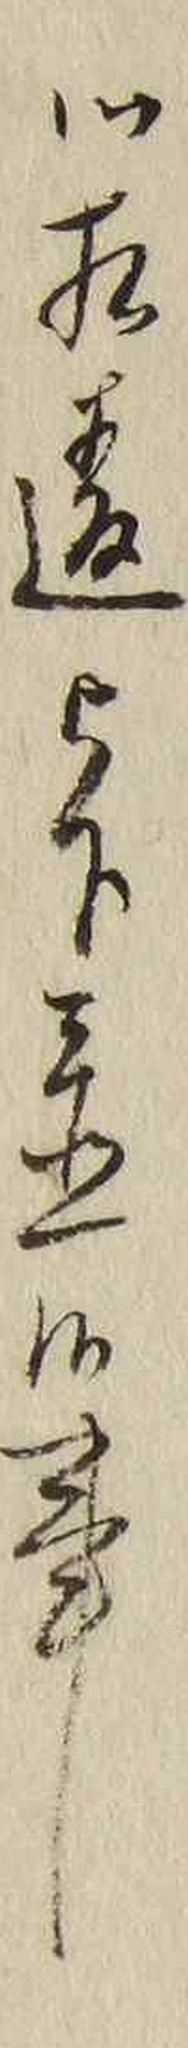御相違被下置候事

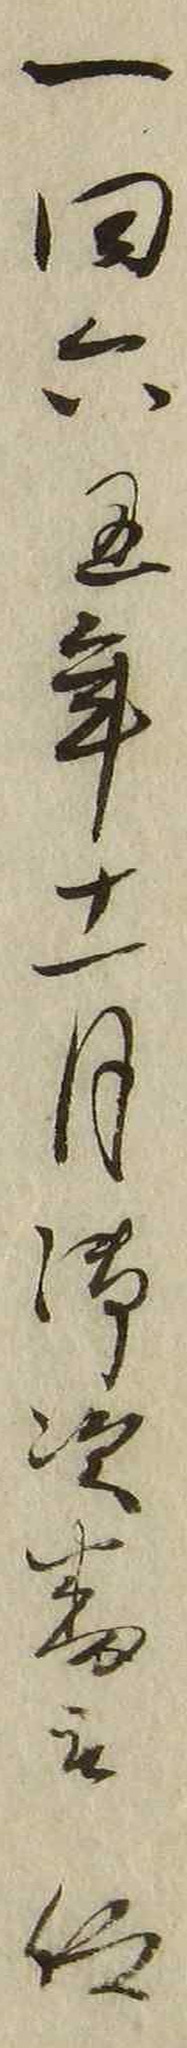一同六丑年十一月御次番被仰
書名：諸士系譜　巻之359　す之部9
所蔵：会津若松市立会津図書館
